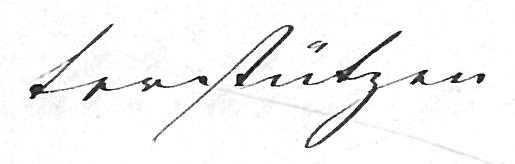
terstützen.
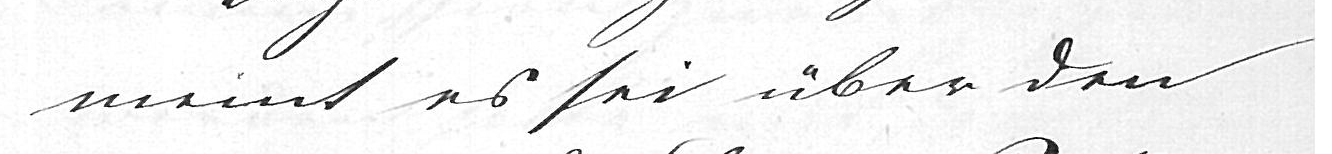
meint es sein über den
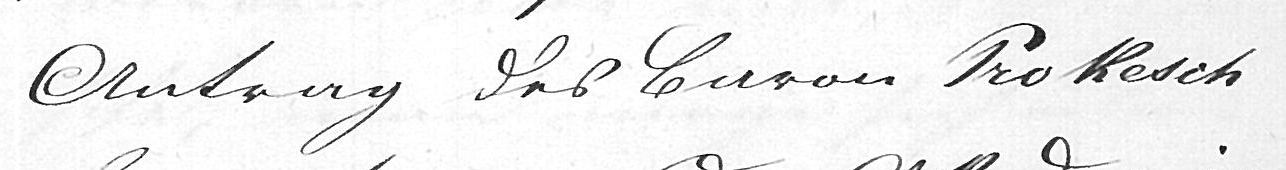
Antrag des Baron Prokesch
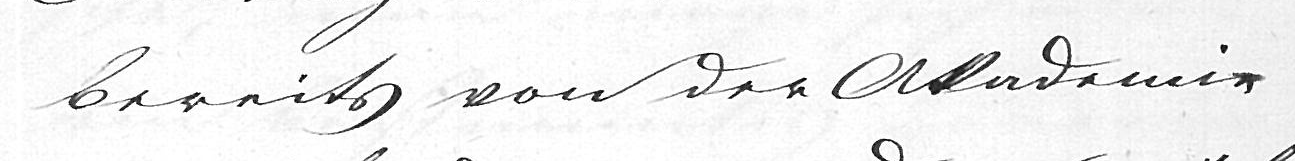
bereits von der Akademie
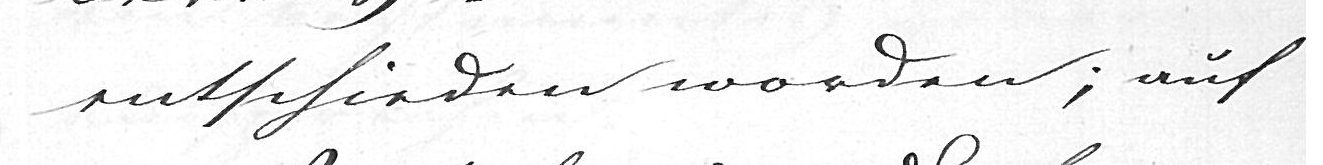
entschieden worden; auf
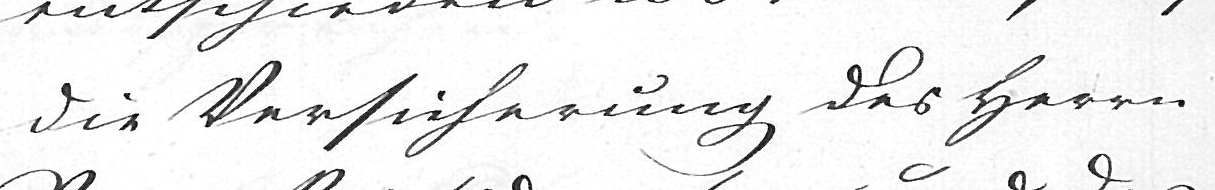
die Versicherung des Herrn
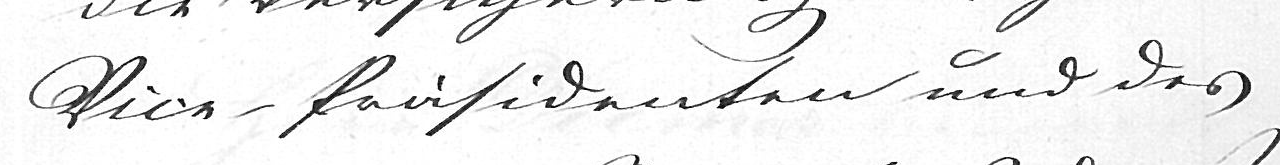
Vice-Präsidenten und des
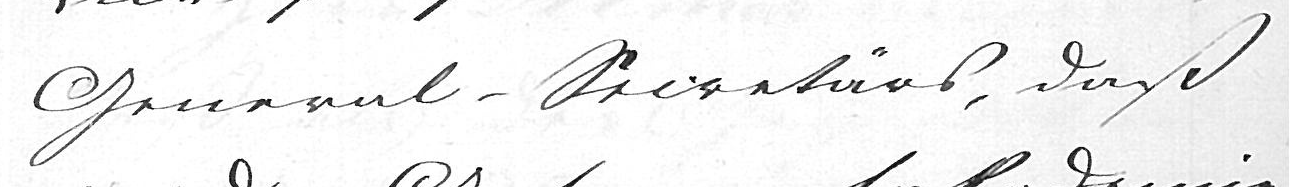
General-Secretärs, daß
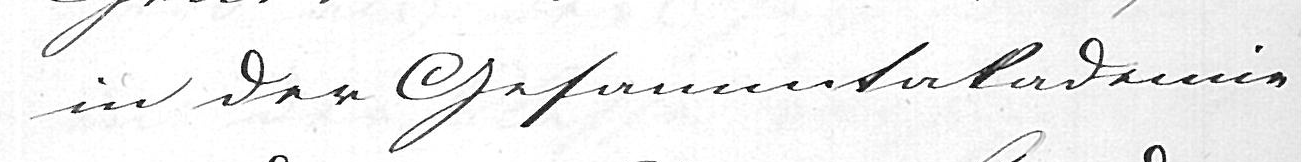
in der Gesanntakademie
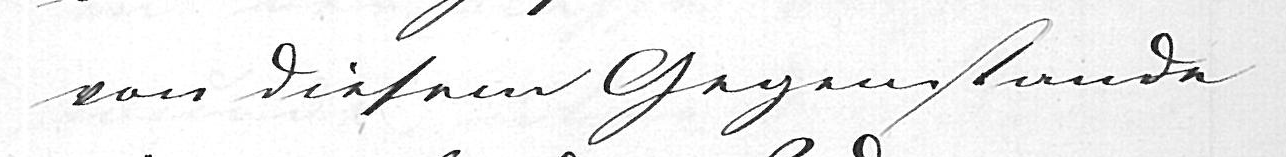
von diesem Gegenstande
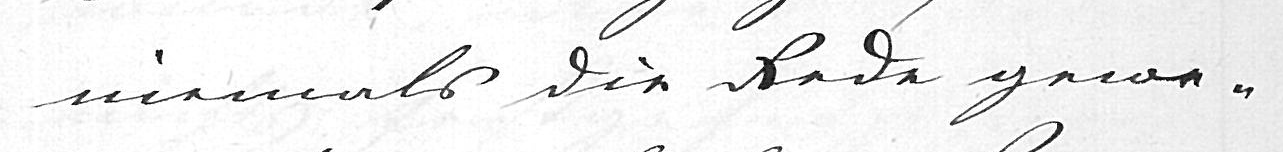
niemals die Rede gewe-
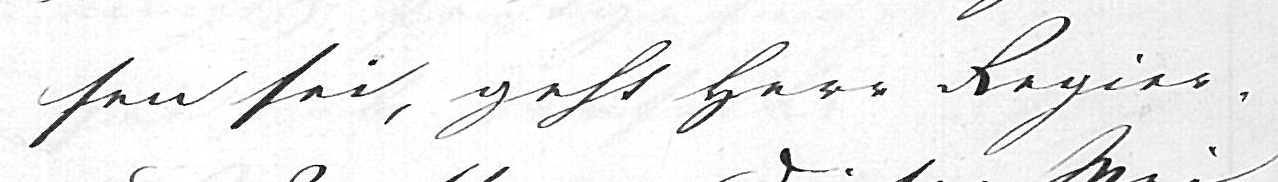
sen sei, geht Herr Regier-
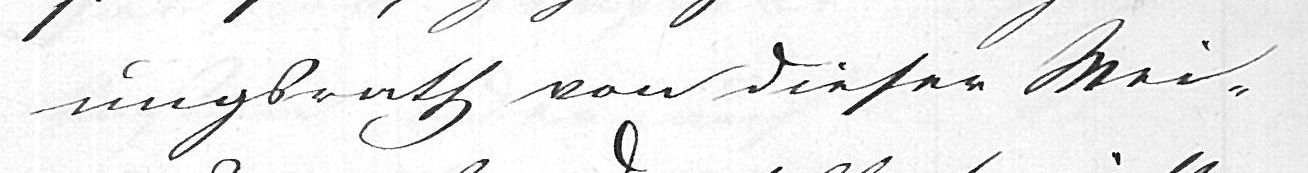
ungsrath von dieser Mei-
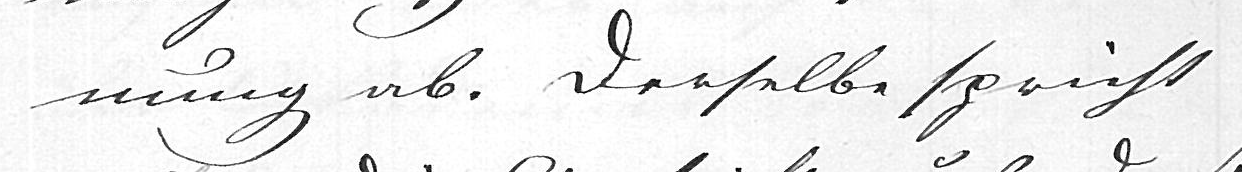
nung ab. Derselbe spricht
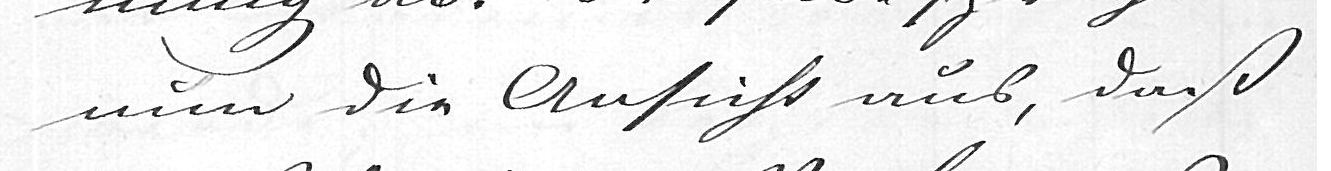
nun die Ansicht aus, daß
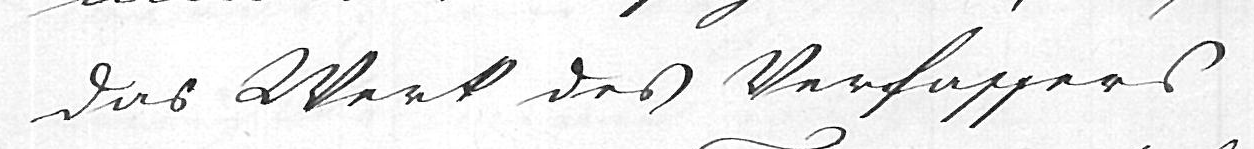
das Wort des Verfassers
